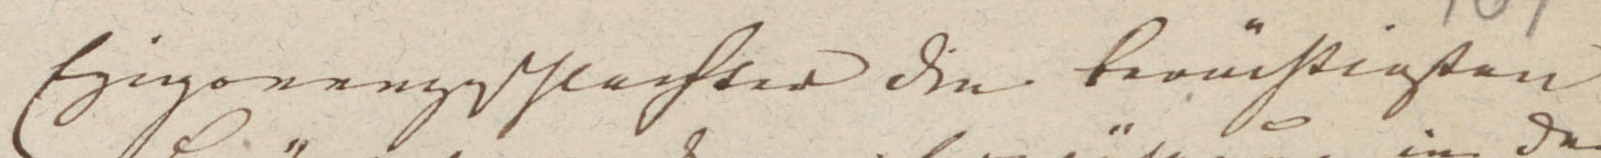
Epigonengeschlechter die berüchtigten
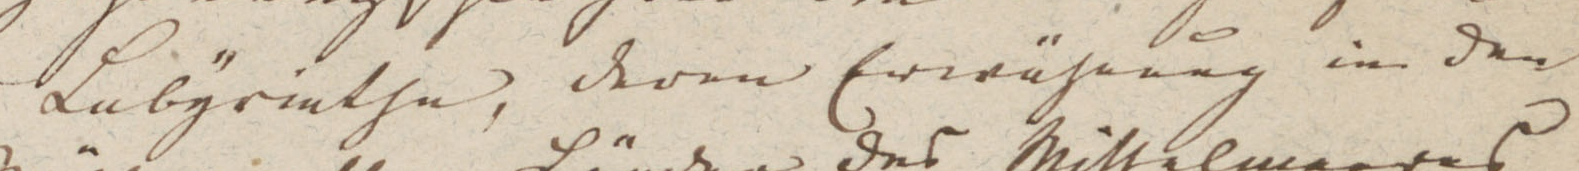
Labyrinthe, deren Erwähnung in den
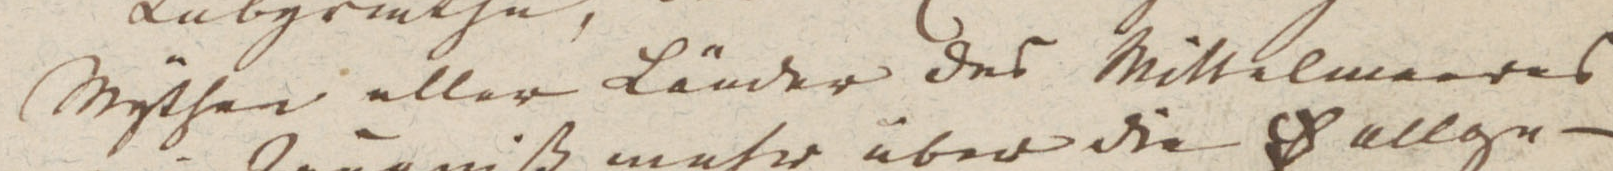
Mythen aller Länder des Mittelmeeres
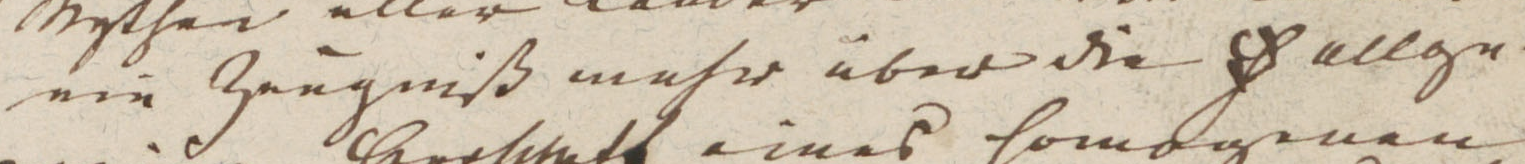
ein Zeugniss mehr über die H allge-
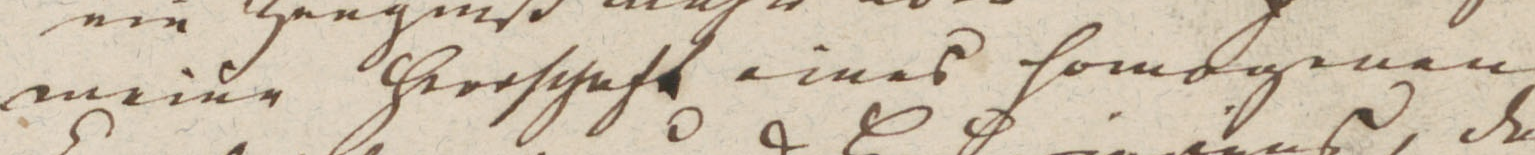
meine Herrschaft eines homogenen
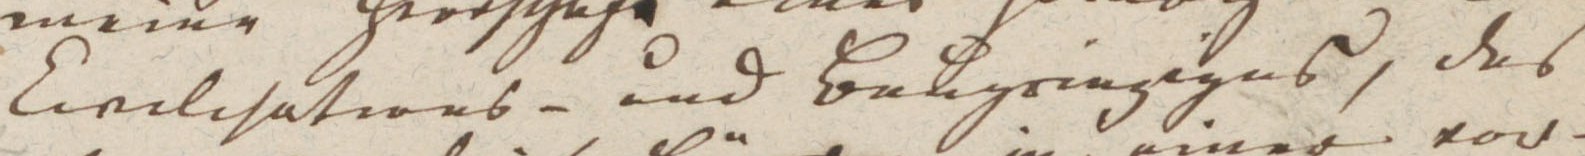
Civilisations- und Bauprinzipes, das
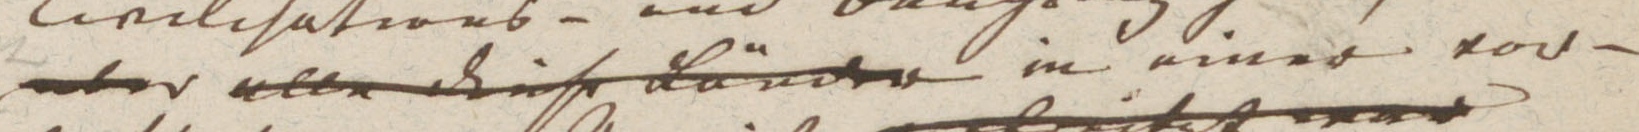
aber alle diese Länder in einer vor-
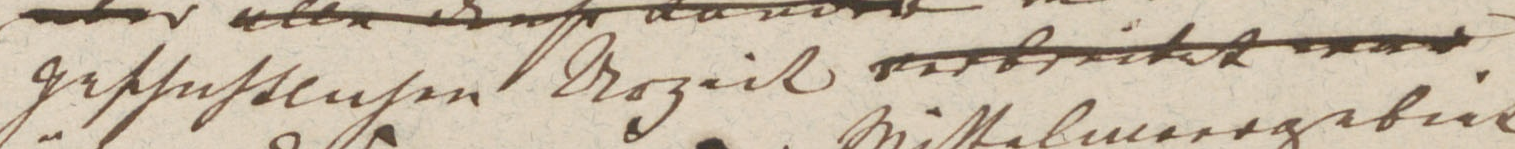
geschichtlichen Urzeit verbreitet war
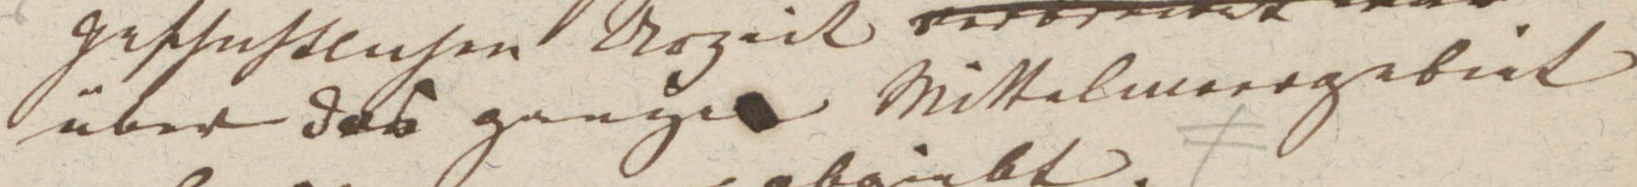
über denas ganzen Mittelmeergebiet
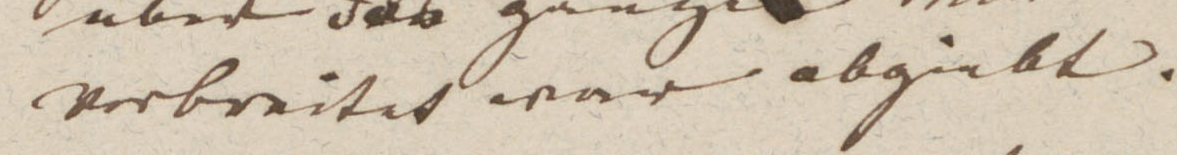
verbreitet war abgiebt. %
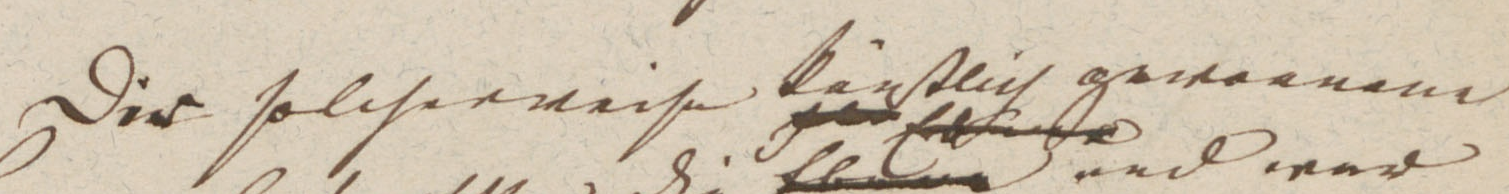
Derie solcherweise künstlich gewonnene
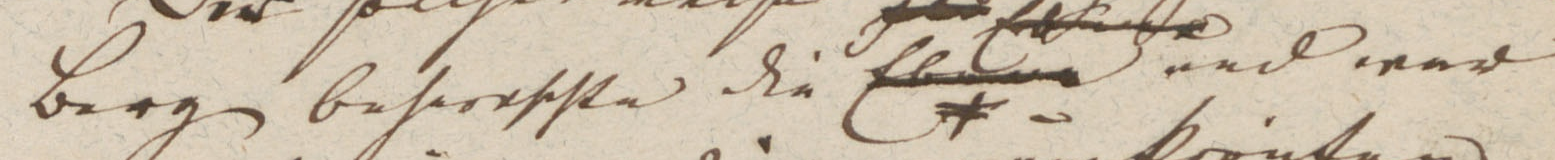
Berg beherrschte die Ebene Ebene % und war
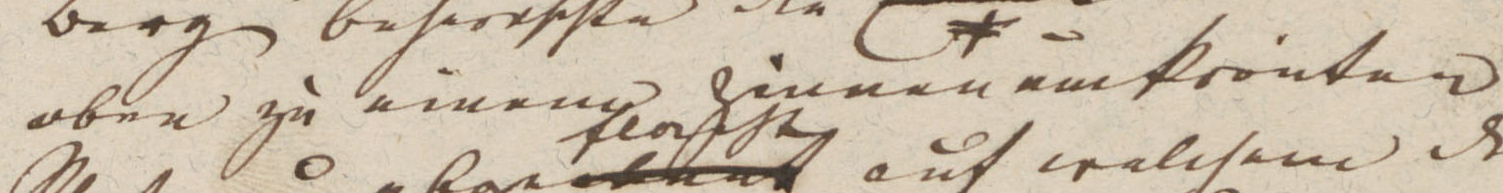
oben zu einem innenumkrönten
